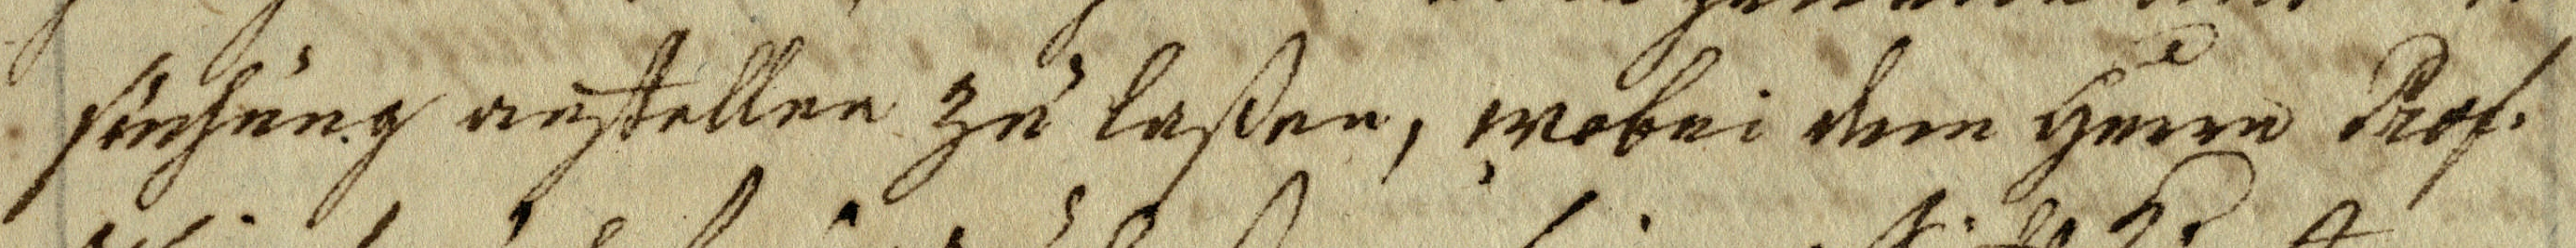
suchung anstellen zu laßen, wobei dem Herrn Prof.
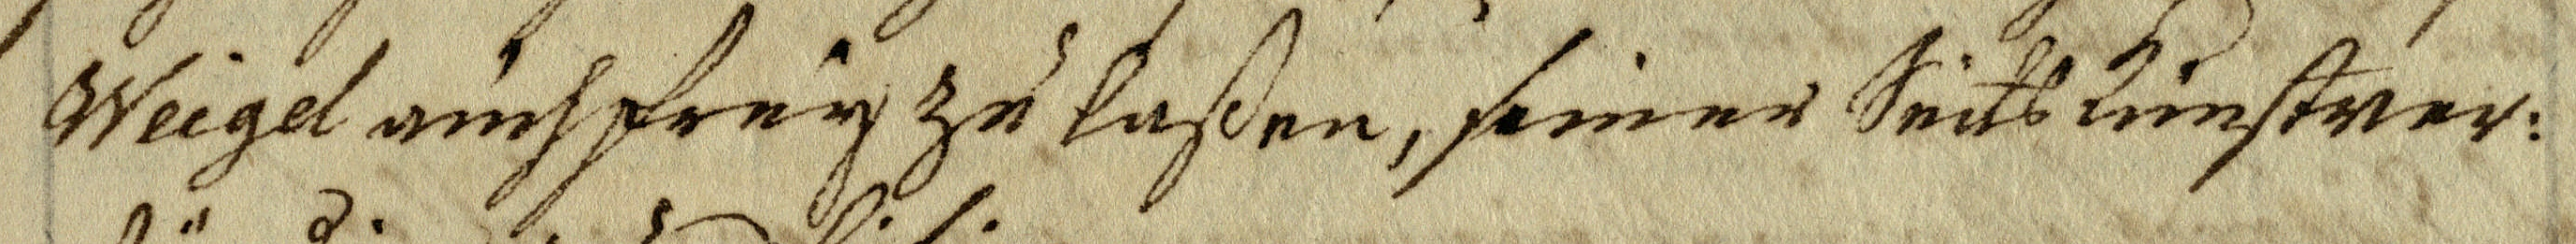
Weigel auch freÿ zu laßen, seiner Seits Kunstver¬
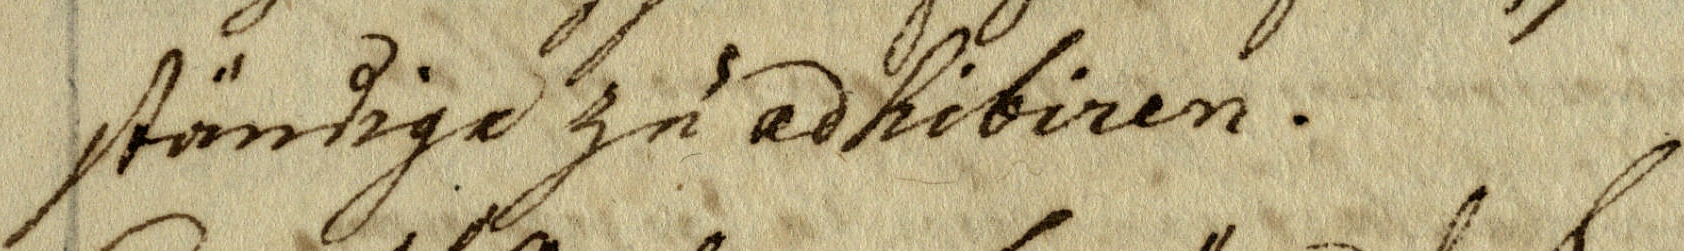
ständige zu adhibiren.
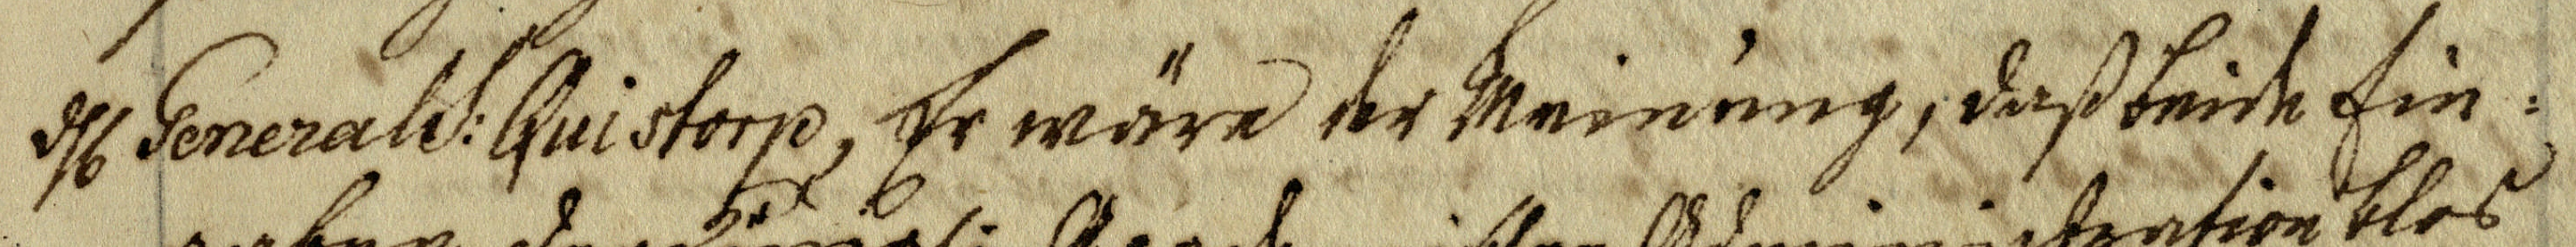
dh GeneralS. Quistorp, Er wäre der Meinung, daß beide Ein¬
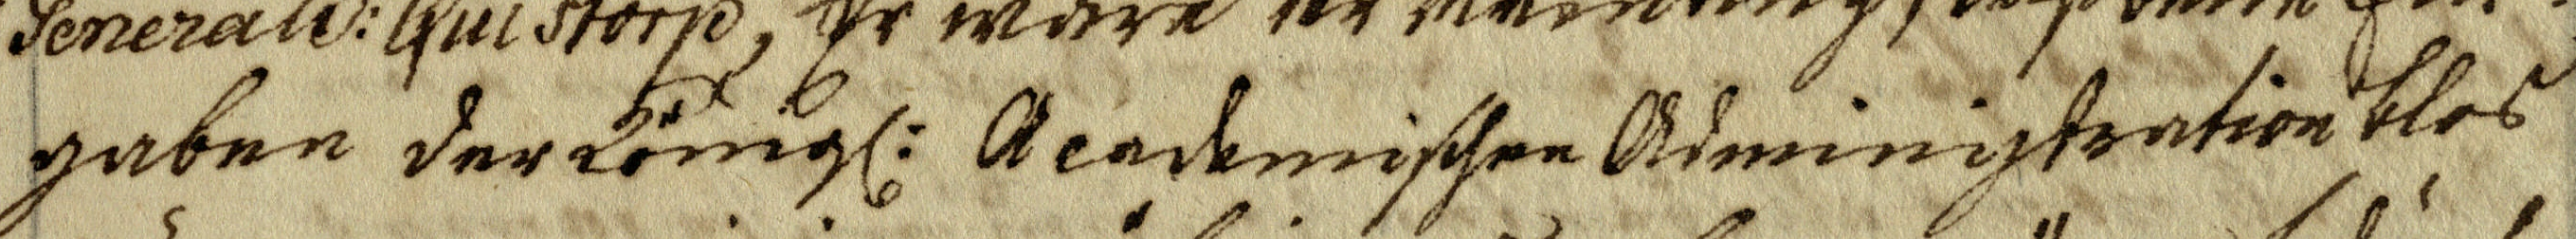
gaben der Königl. Academischen Administration blos
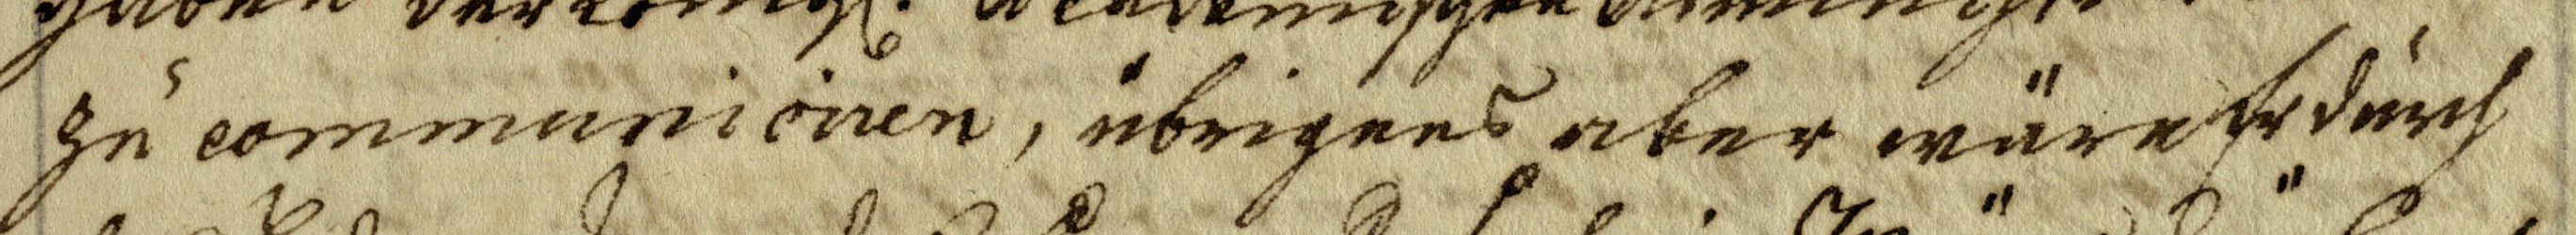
zu communiciren, übrigens aber wäre Er durch
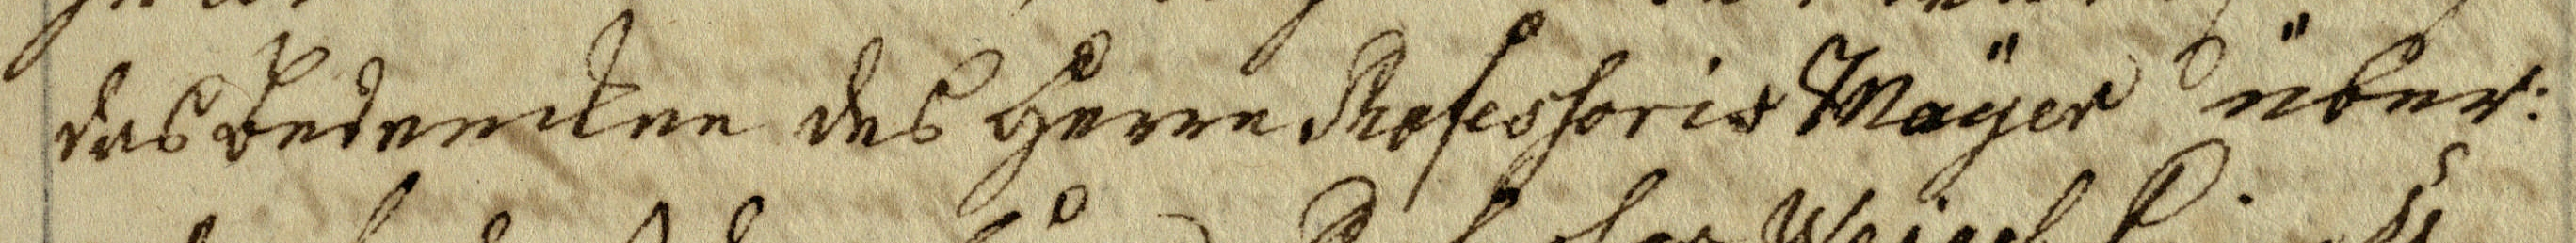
das Bedenken des Herrn Professoris Maÿer über¬
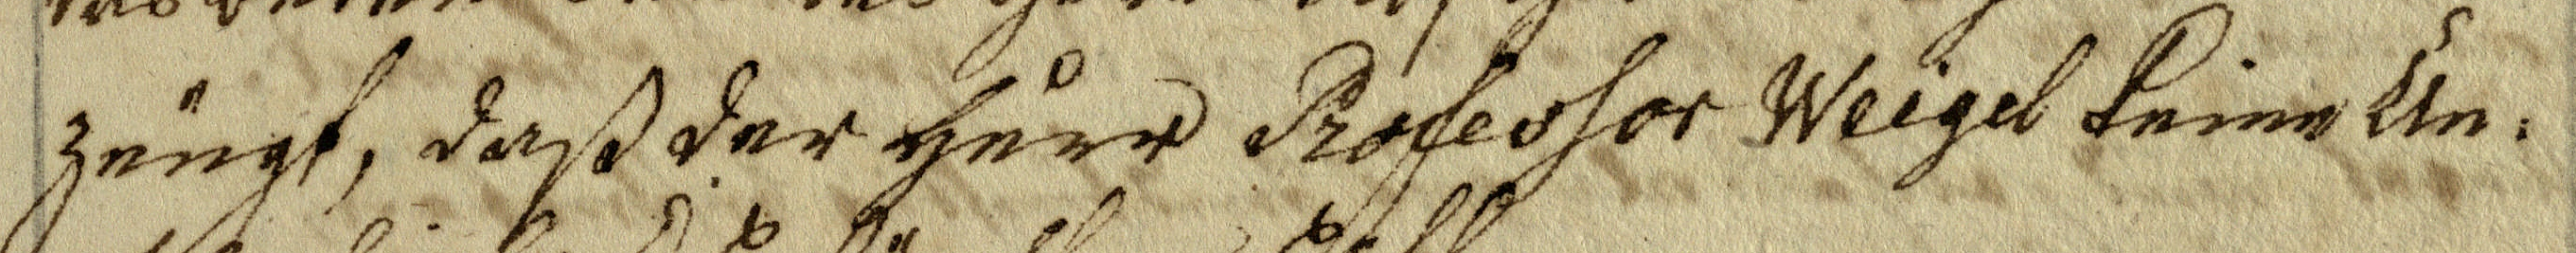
zeugt, daß der Herr Professor Weigel keine Un¬
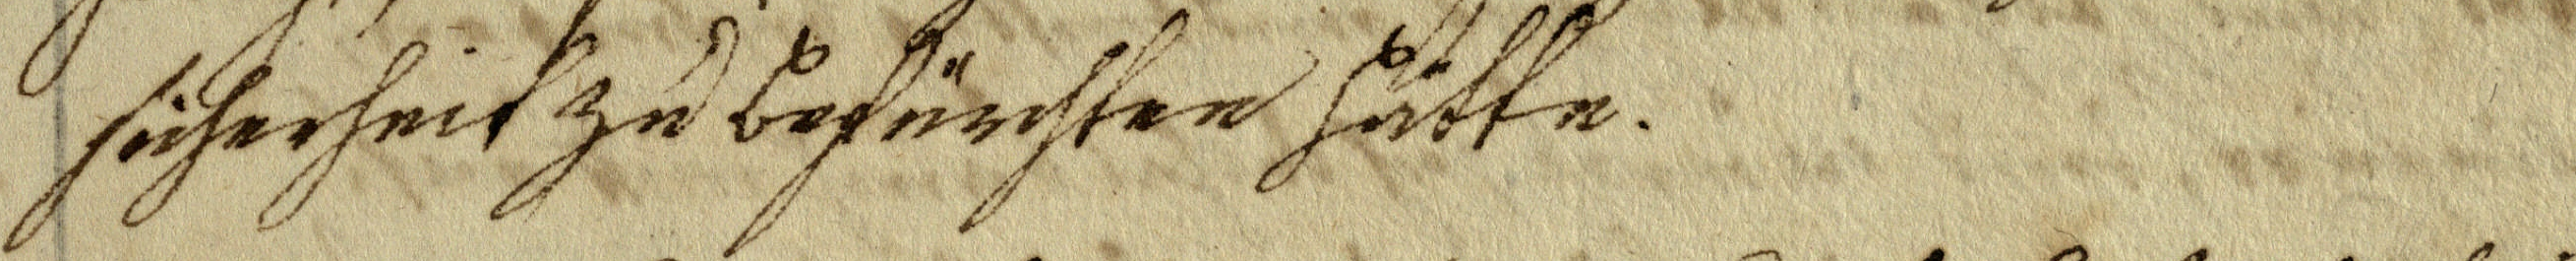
sicherheit zu befürchten hätte.
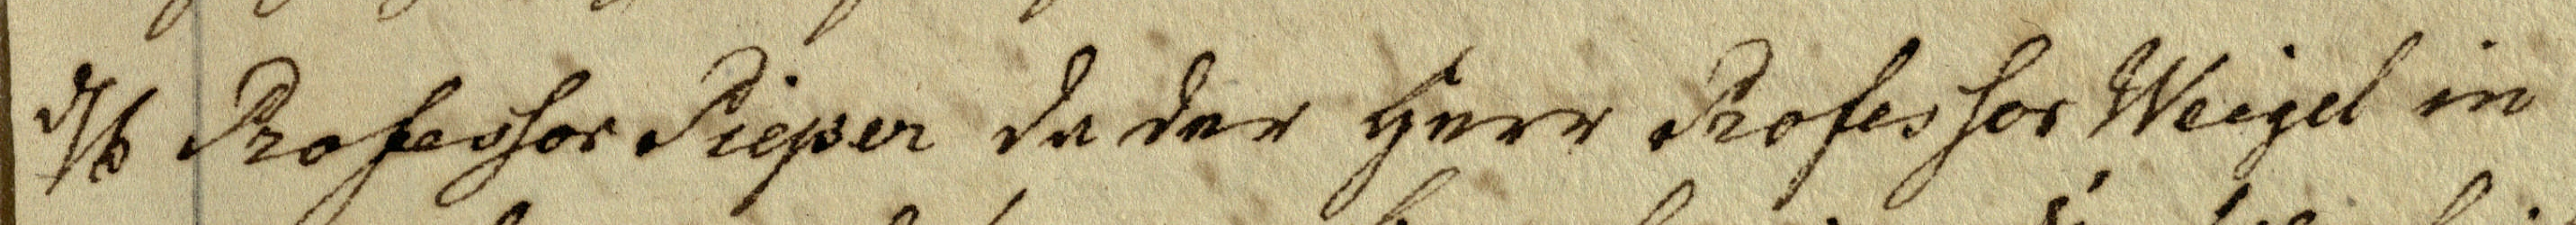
dh Professor Pieper da der Herr Professor Weigel in
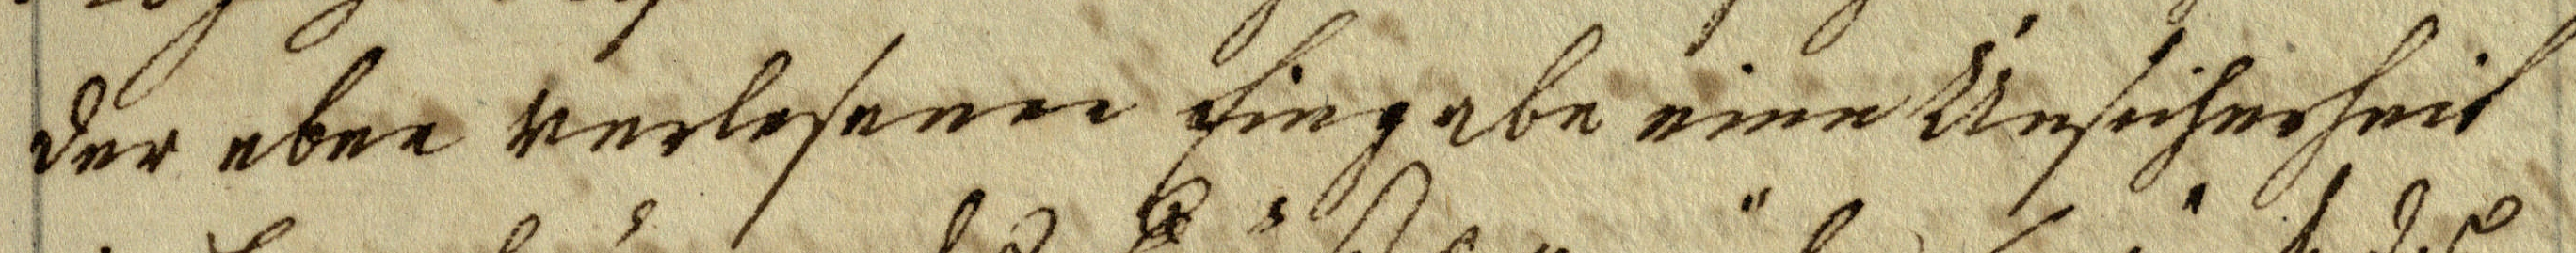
der eben verlesenen Eingabe eine Unsicherheit
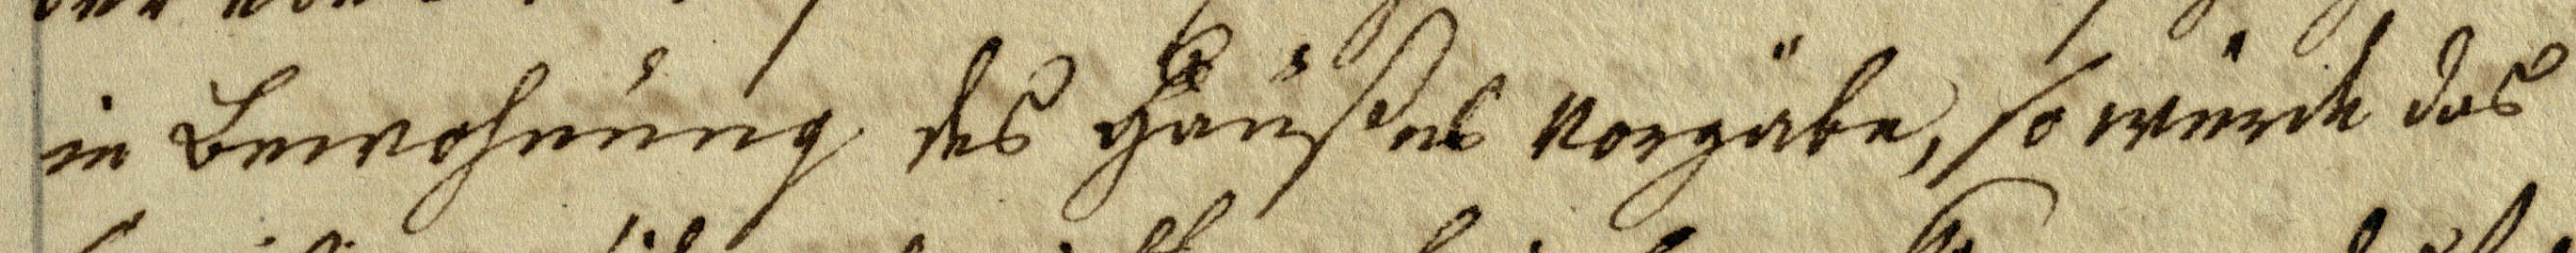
in Bewohnung des Hauses vorgäbe, so würde das
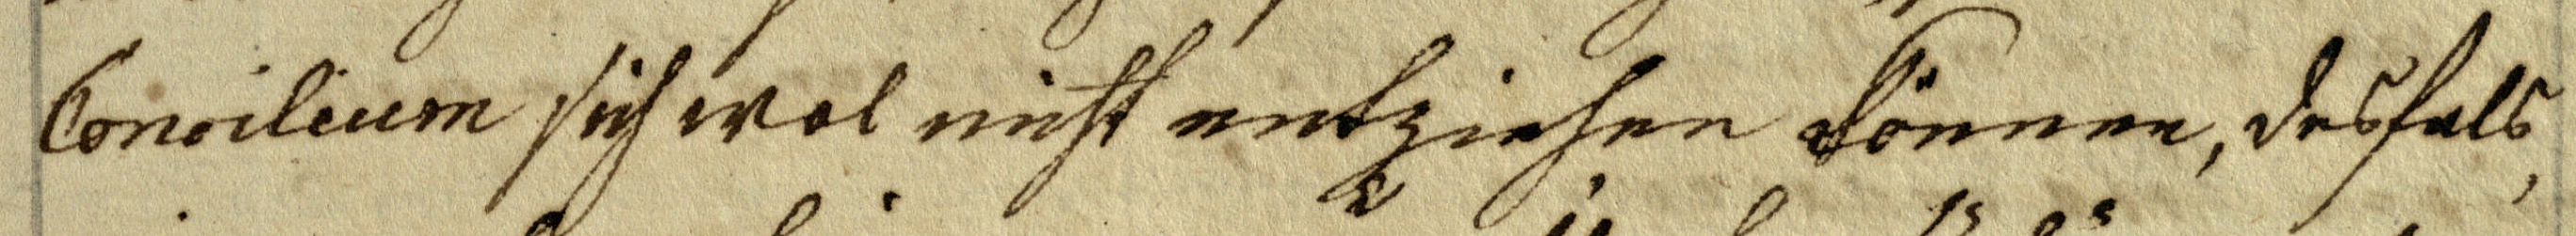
Concilium sich wol nicht entziehen können, desfals,
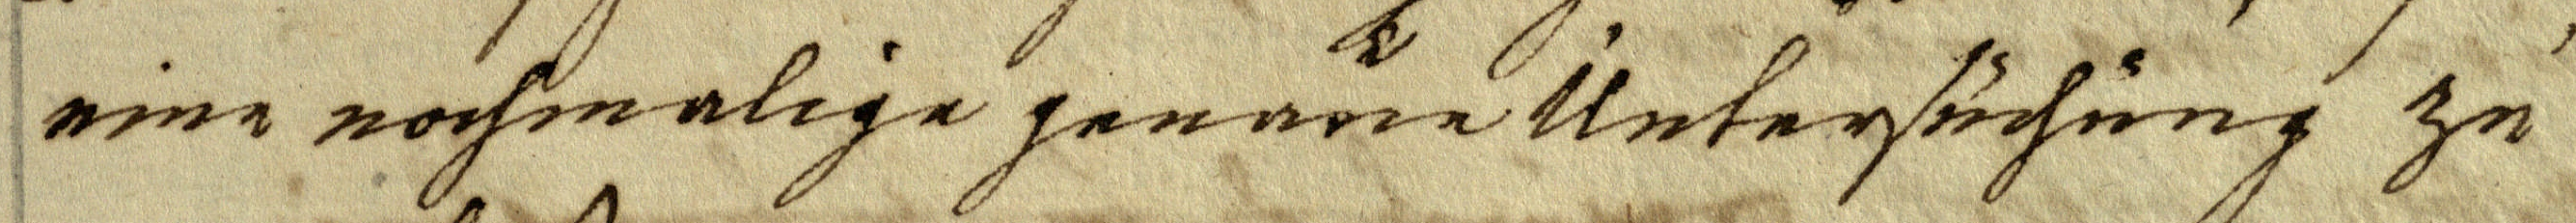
eine nochmalige genaue Untersuchung zu
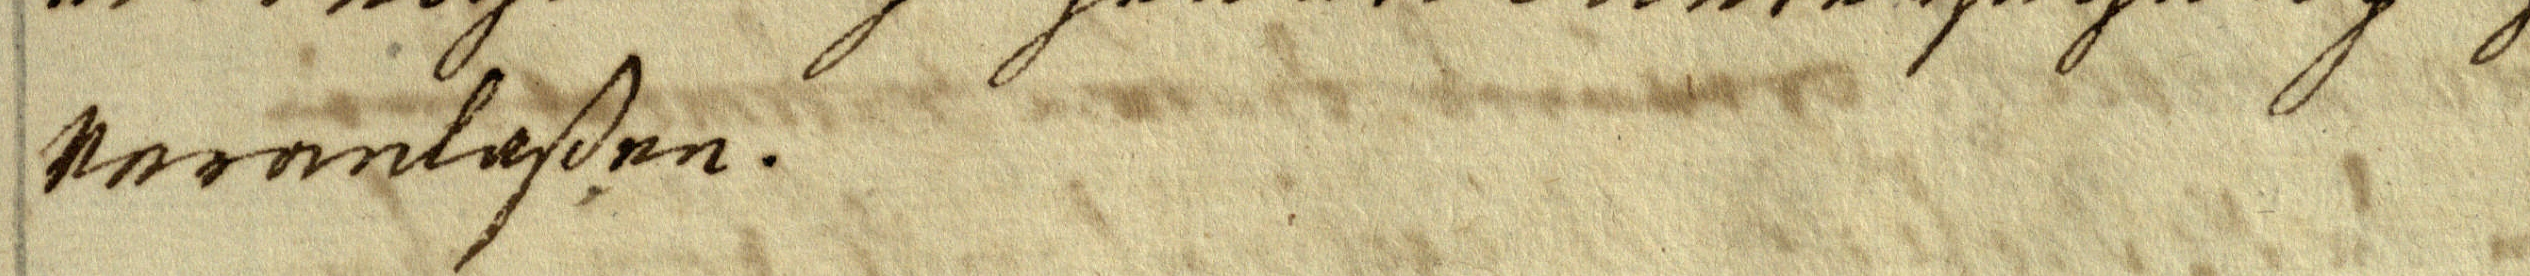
veranlaßen.
